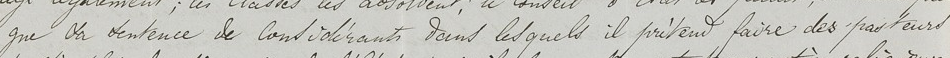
gne sa sentence de Considérants dans lesquels il prétend faire des pasteurs
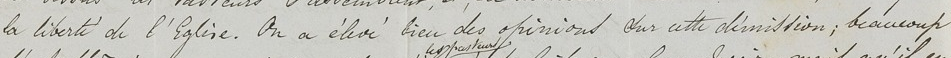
la liberté de l'Eglise. On a élevé bien des opinions sur cette démission; beaucoup
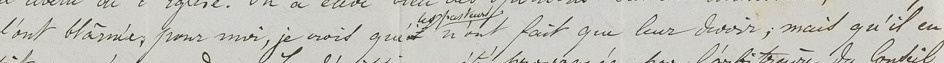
l'ont blâmée; pour moi, je crois que 'illes pasteurs n'ont fait que leur devoir; mais qu'il en
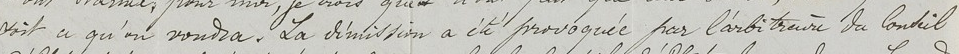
soit ce qu'on voudra. La démission a été provoquée par l'arbitraire du Conseil
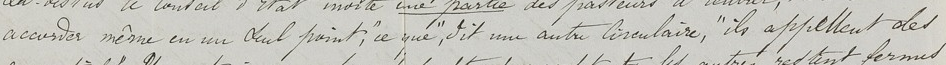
accorder même en un seul point; «ce que», dit une autre Circulaire, «ils appellent des
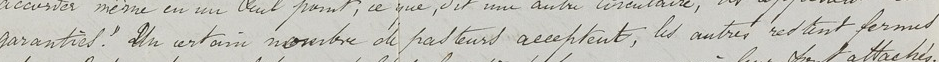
garanties». Un certain nombre de pasteurs acceptent, les autres restent fermes
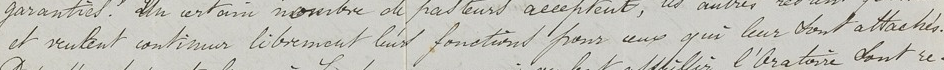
et veulent continuer librement leurs fonctions pour ceux qui leur sont attachés.
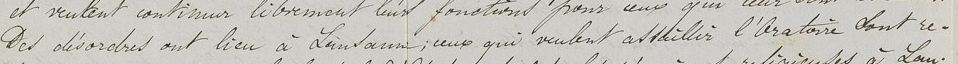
Des disordres ont lieu à Lausanne; ceux qui veulent assaillir l'Oratoire sont re-
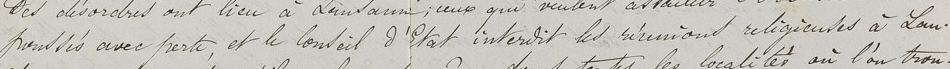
poussés avec perte, et le Conseil d'Etat interdit les réunions religieuses à Lau-
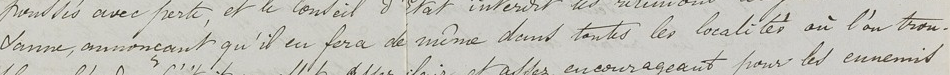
sanne, annonçant qu'il en fera de même dans toutes les localités où l'on trou-
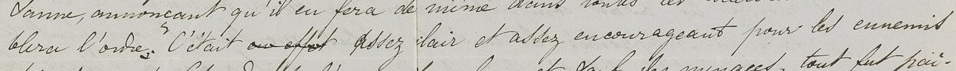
blera l'ordre. C'était en effet assez clair et assez encourageant pour les ennemis
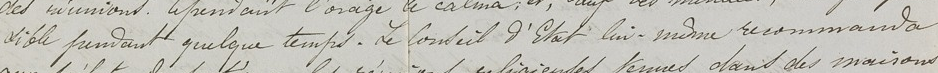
sible pendant quelque temps. Le Conseil d'Etat lui-même recommanda
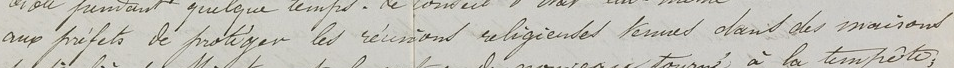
aux préfets de protéger les réunions religieuses tenues dans des maisons
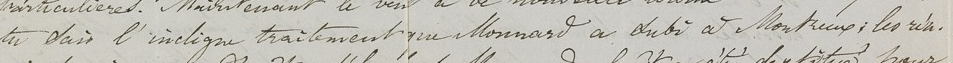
tu sais l'indigne traitement que Monnard a subi à Montreux; les réu-
